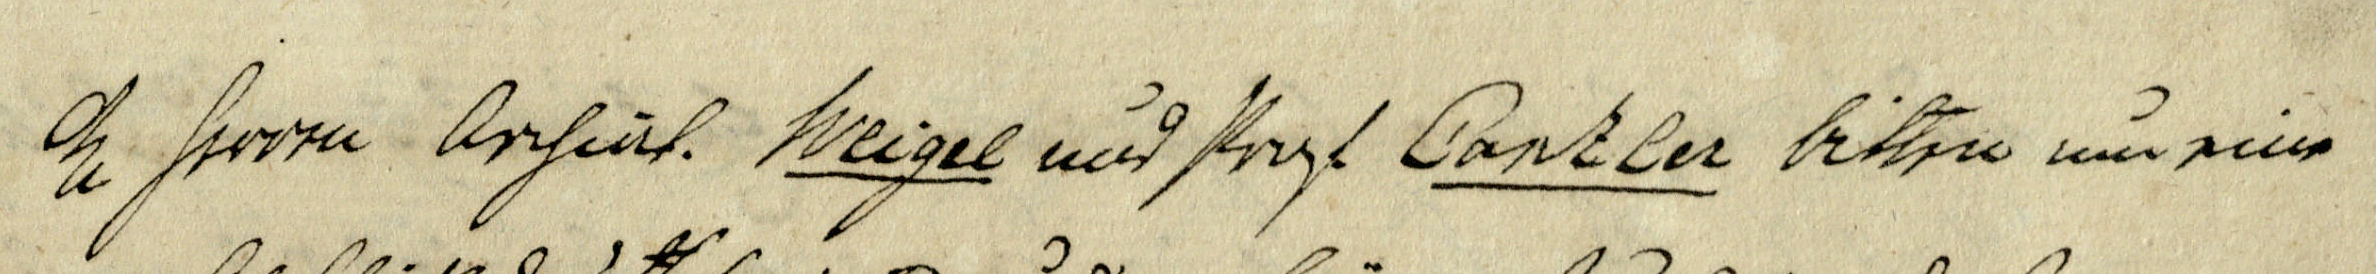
dh. Herren Archiat. Weigel und Prof Canzler bitten um eine
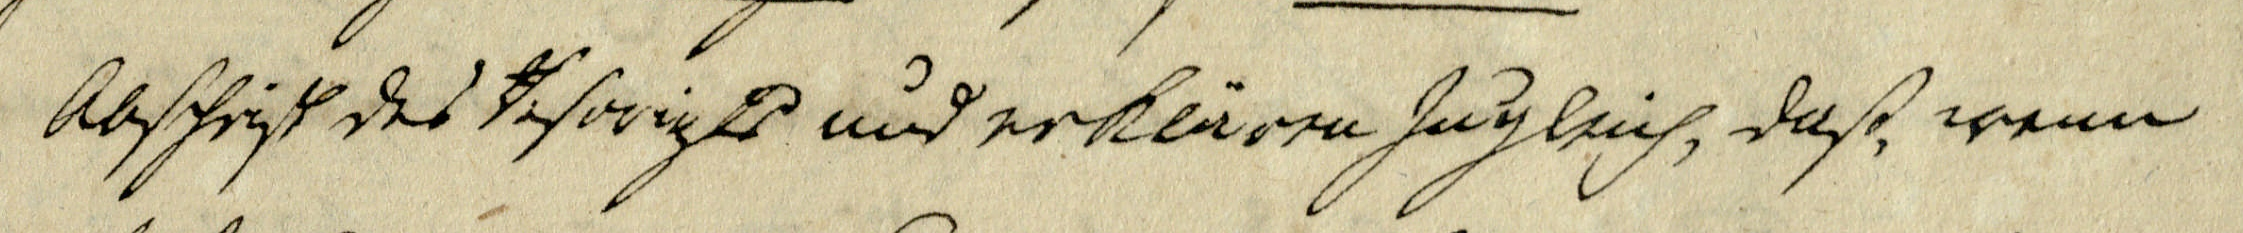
Abschrift des Rescripts und erklären zugleich, daß, wenn
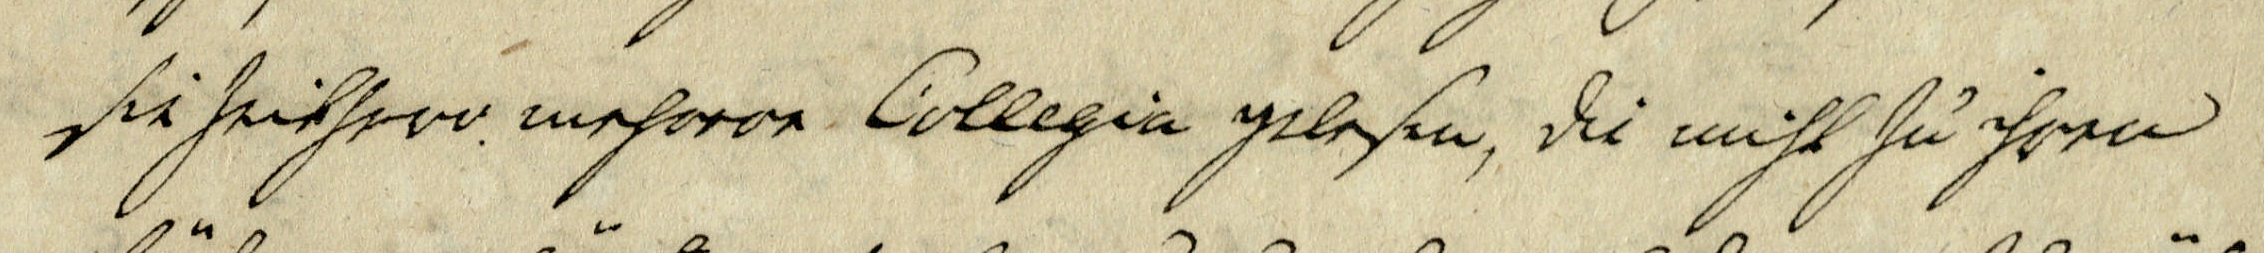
sie zeithero mehrere Collegia gelesen, die nicht zu ihren
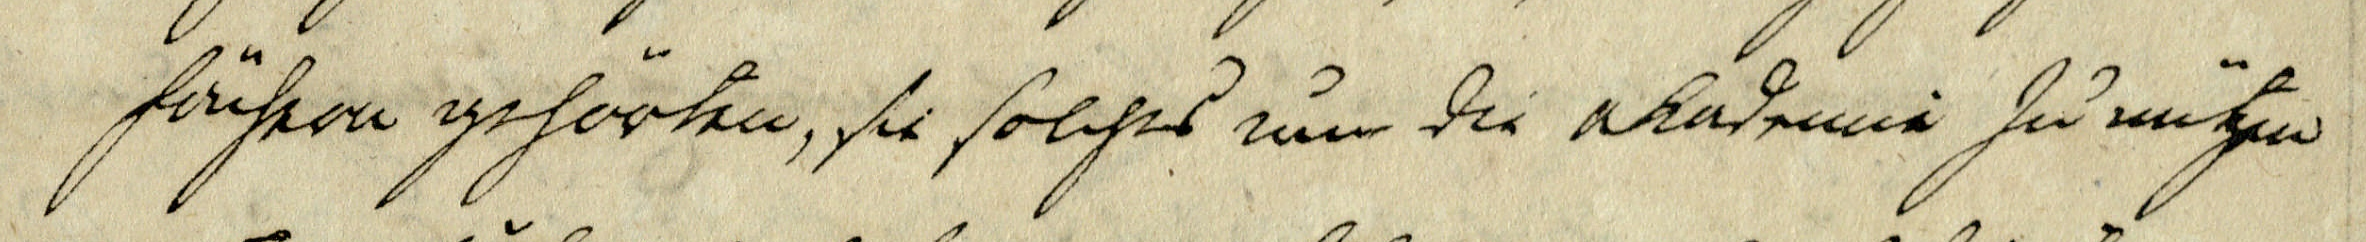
Fächern gehörten, sie solches um der Akademie zu nützen
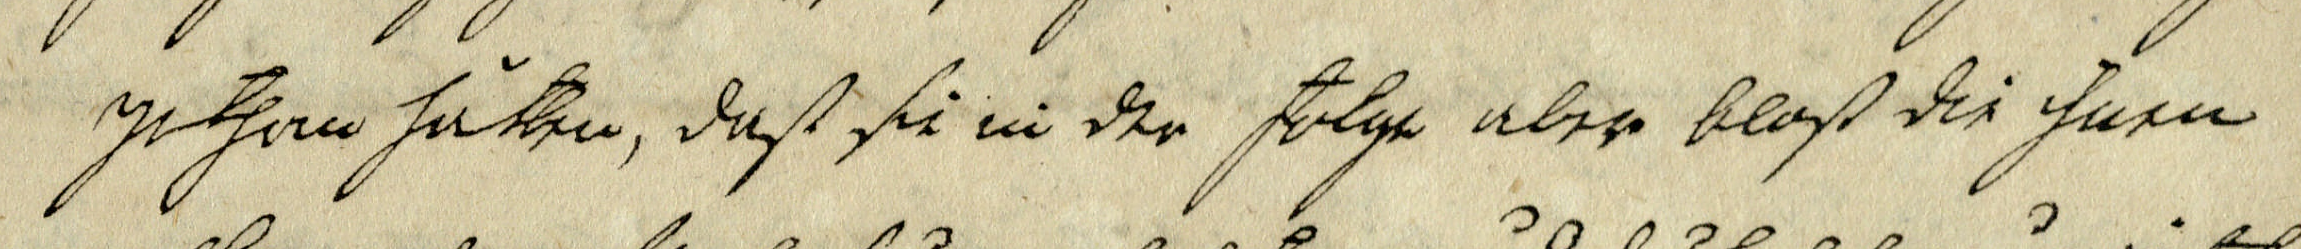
gethan hätten, daß sie in der Folge aber bloß die ihnen
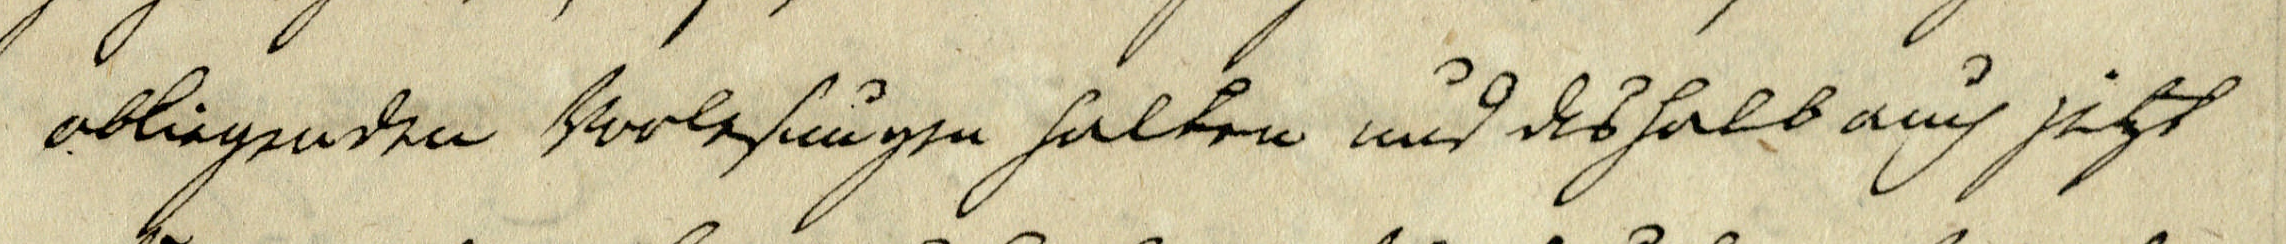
obliegenden Vorlesungen halten und deshalb auch jetzt
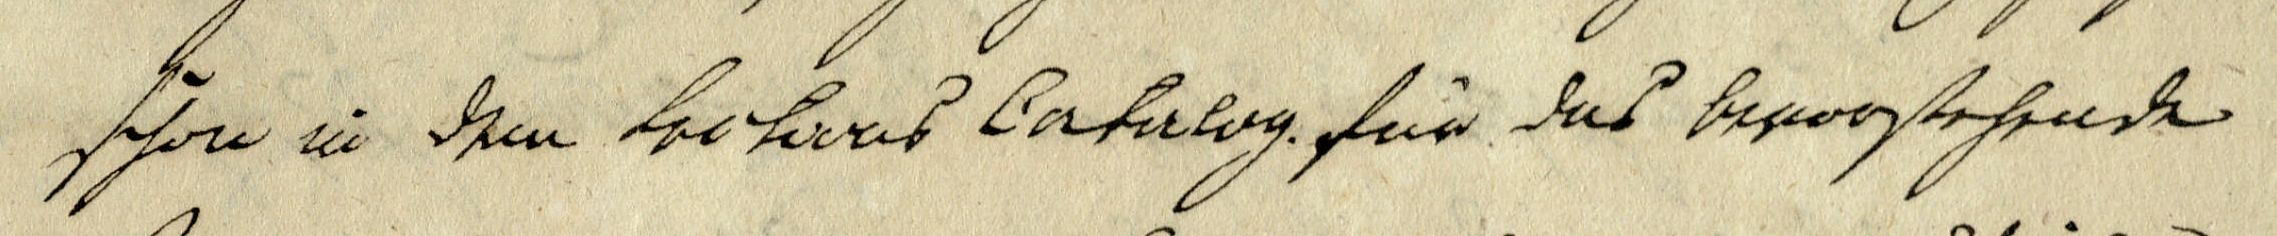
schon in dem Lections Catalog für das bevorstehende
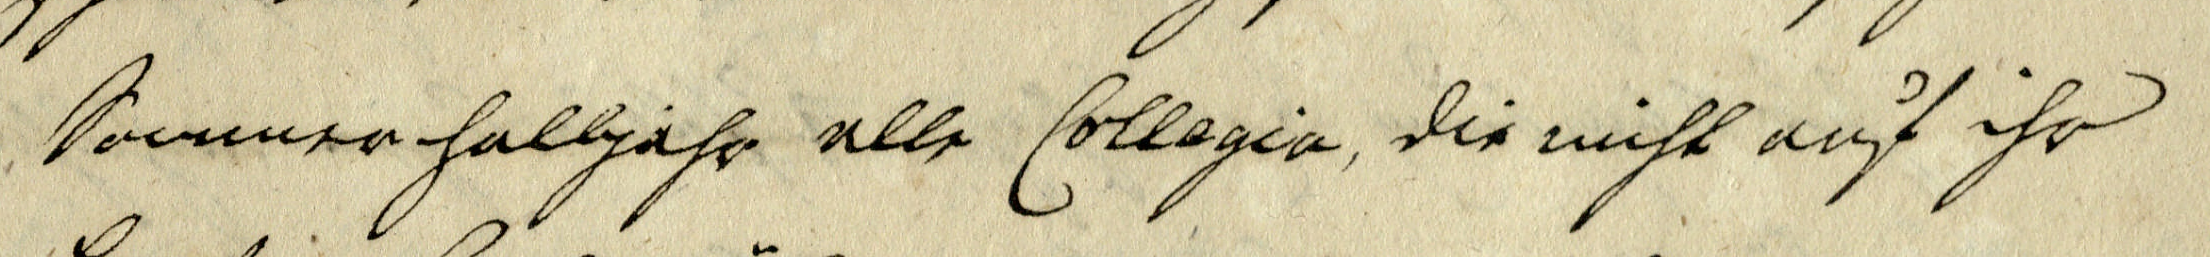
Sommerhalbjahr alle Collegia, die nicht auf ihr
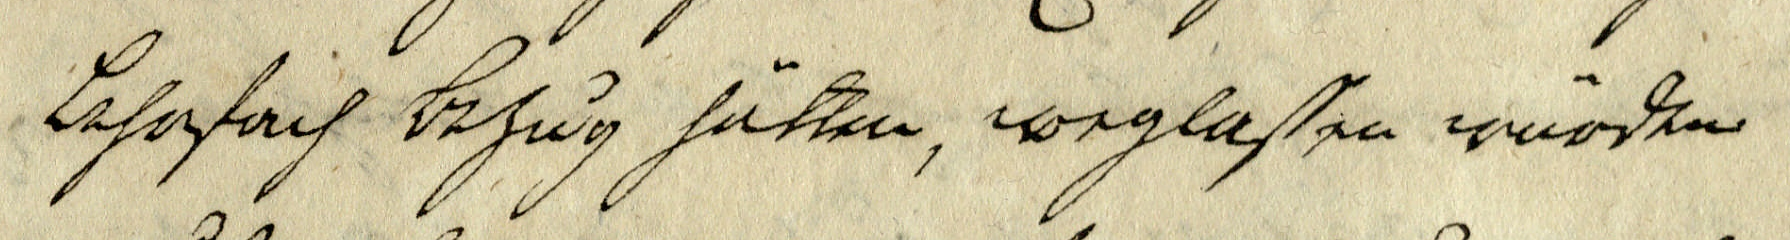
Lehrfach Bezug hätten, weglassen würden.
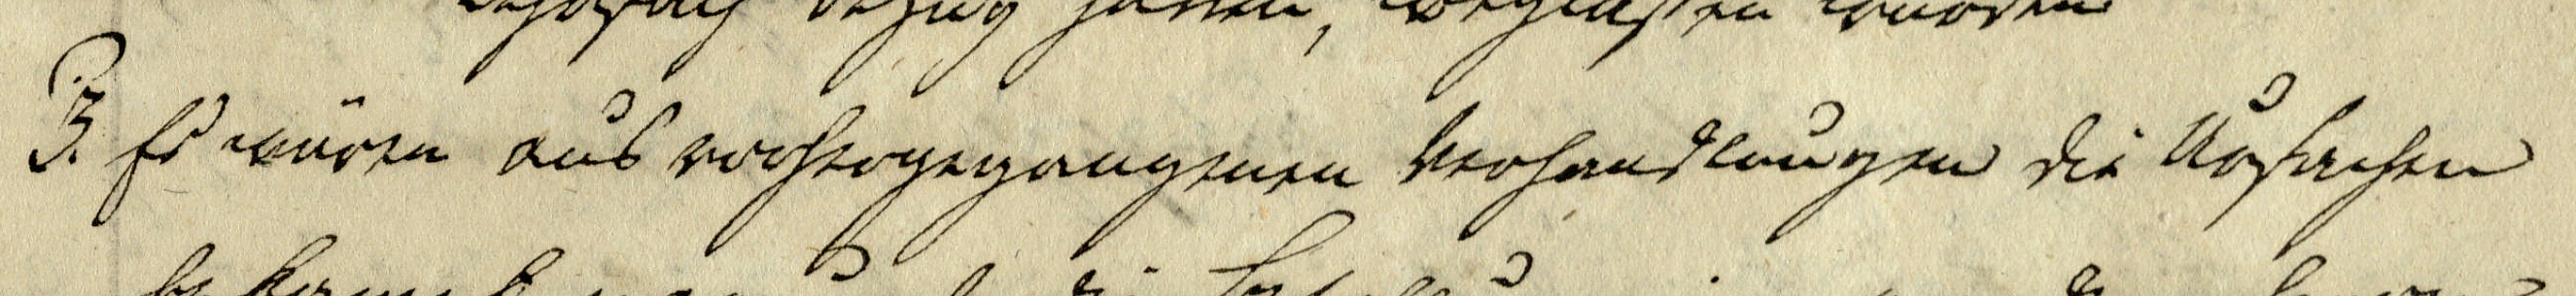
3. Es wären aus vorhergegangenen Verhandlungen die Ursachen
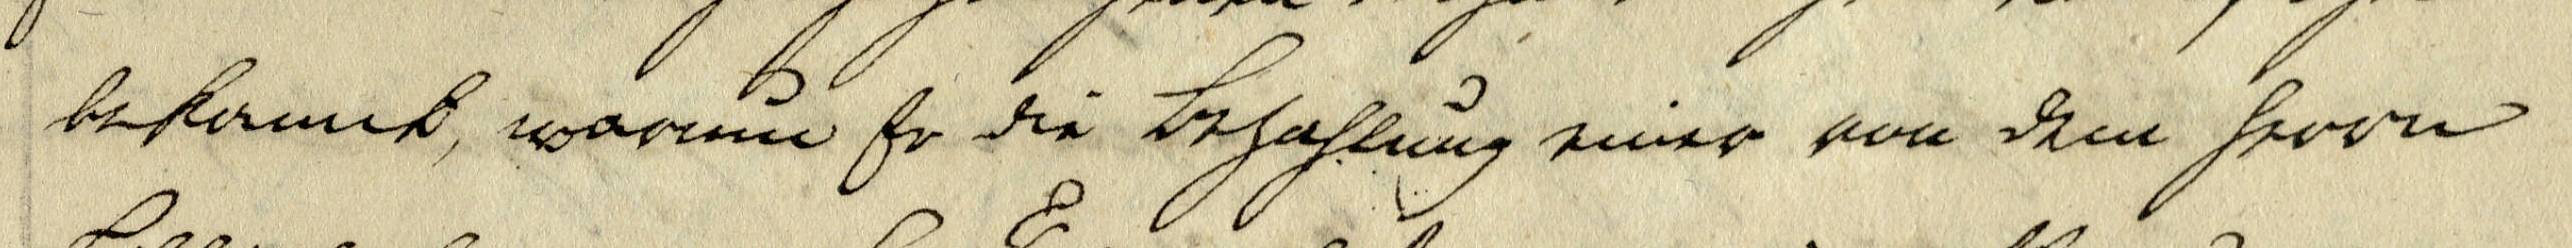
bekannt, warum Er die Bezahlung einer von dem Herrn
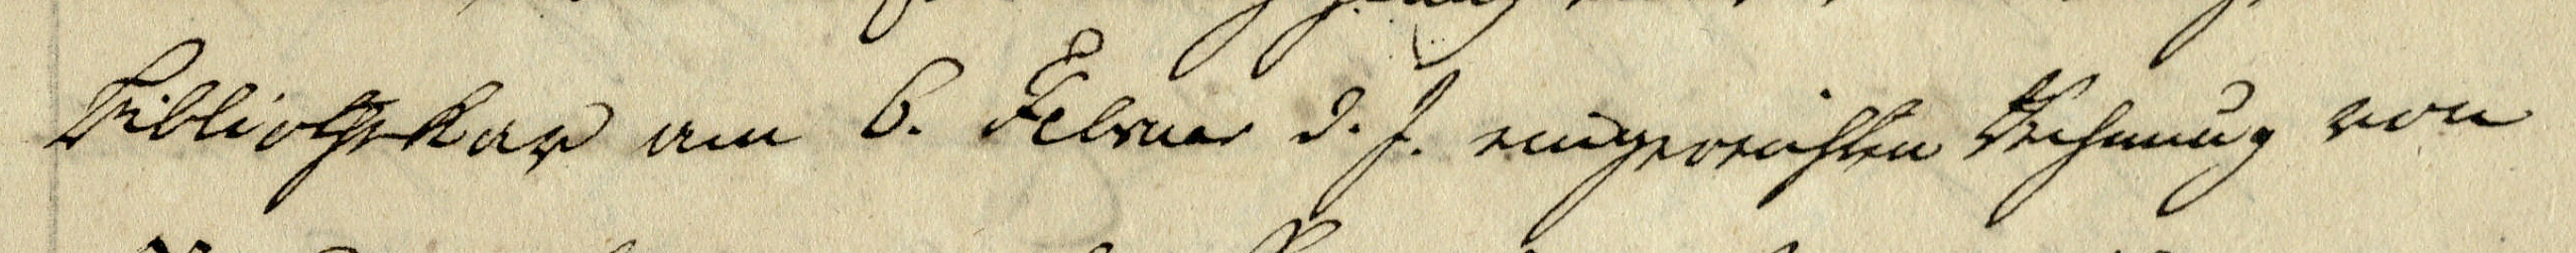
Bibliothekar am 6. Februar d. J. eingereichten Rechnung von
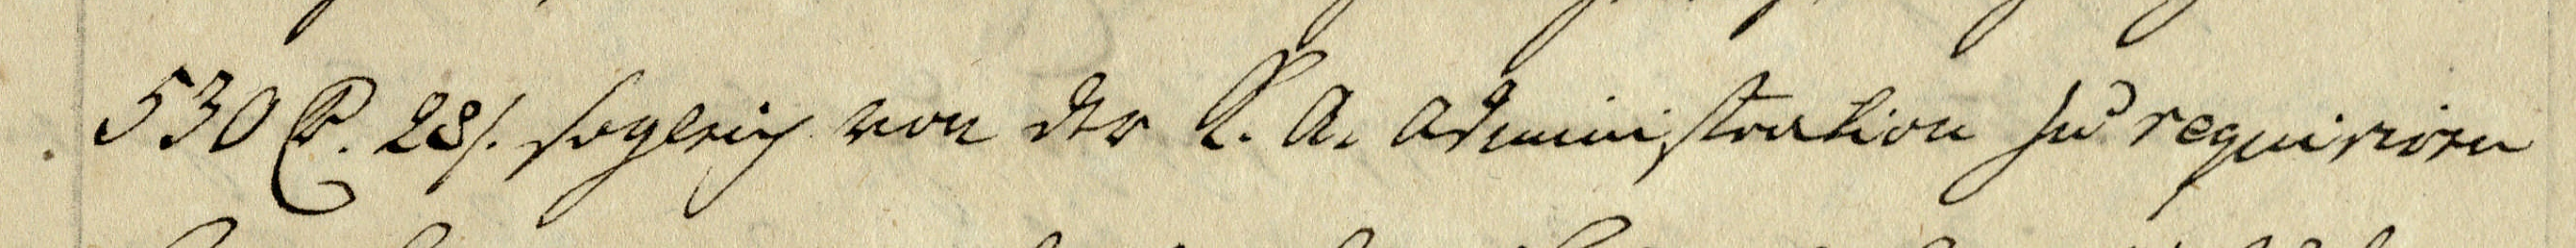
530 l. 28 s. sogleich von der K. A. Administration zu requiriren
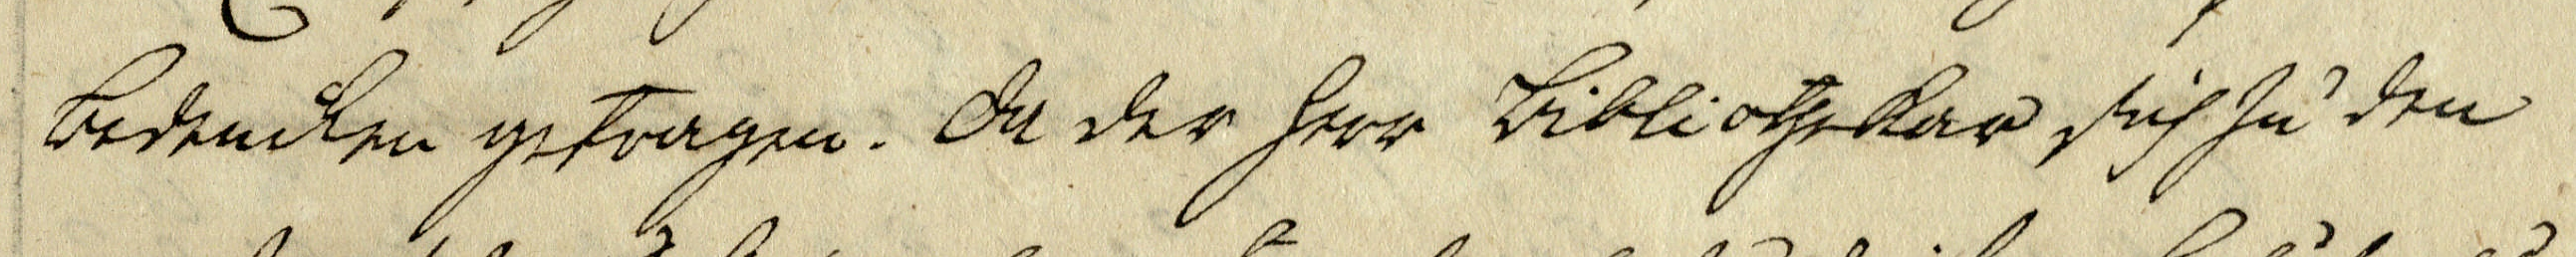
Bedencken getragen. Da der Herr Bibliothekar sich zu den
